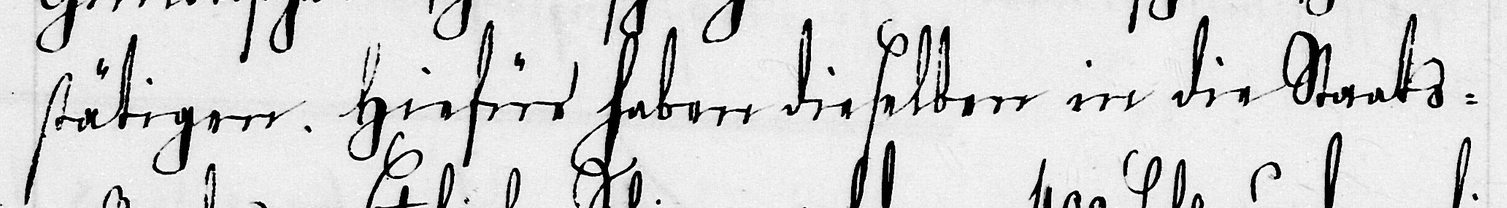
stätigen. Hiefür haben dieselben in die Staats¬
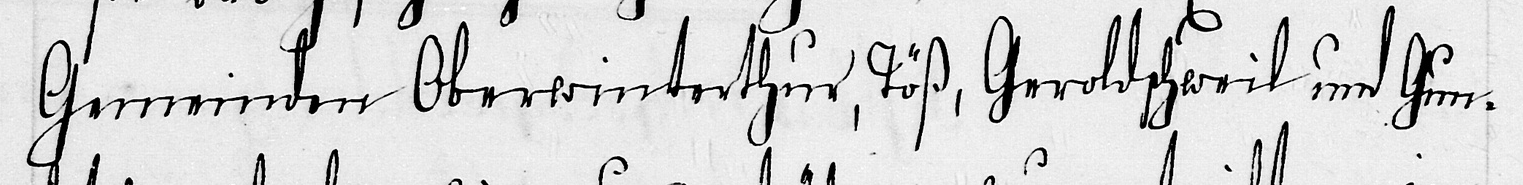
Gemeinden Oberwinterthur, Töß, Geroldschweil und Gun¬
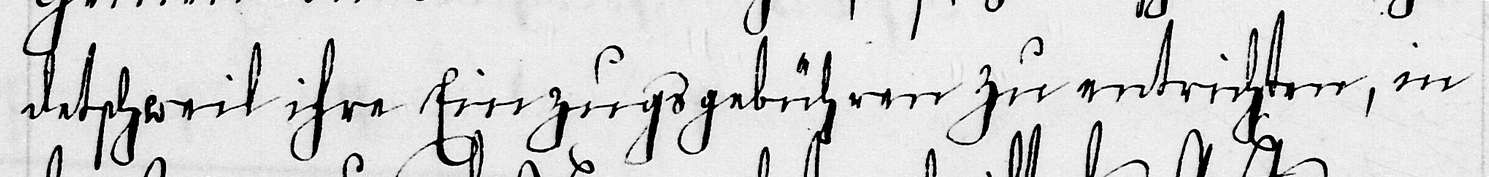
detschweil ihre Einzugsgebühren zu entrichten, in
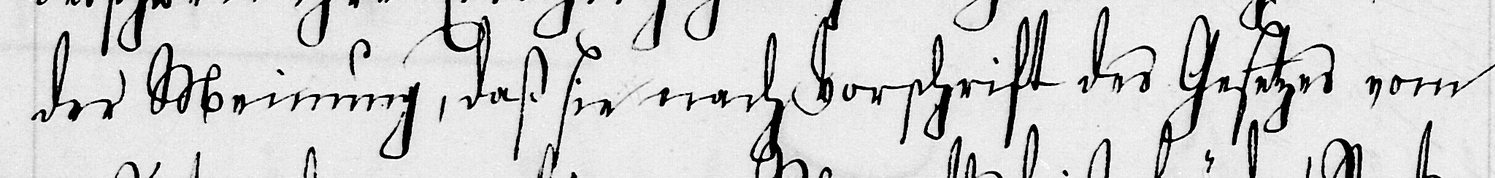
der Meinung, daß sie nach Vorschrift des Gesetzes vom
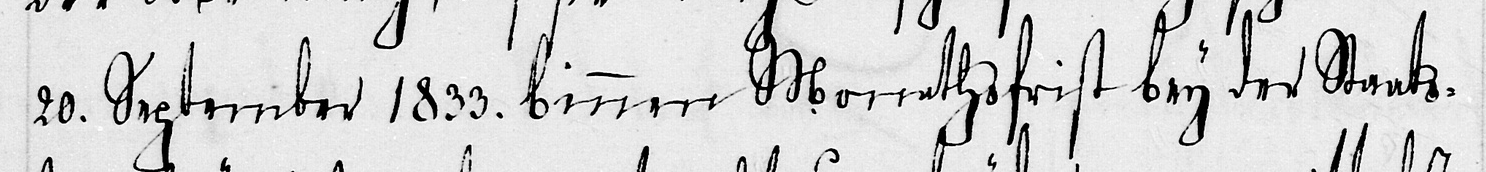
20. September 1833. binnen Monathsfrist bey der Staats¬
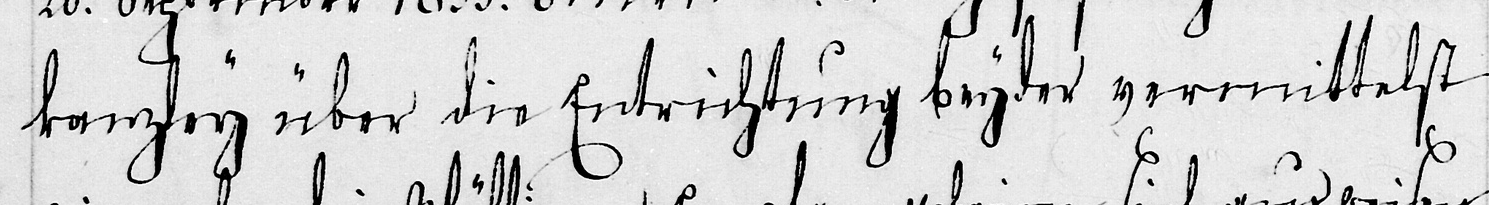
kanzley über die Entrichtung beyder vermittelst
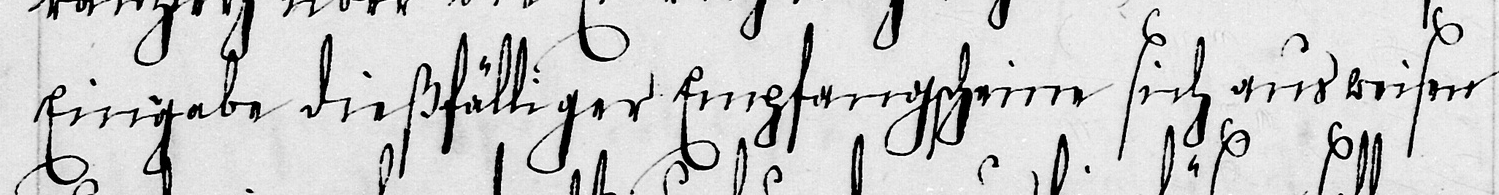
Eingabe dießfälliger Empfangscheine sich ausweisen
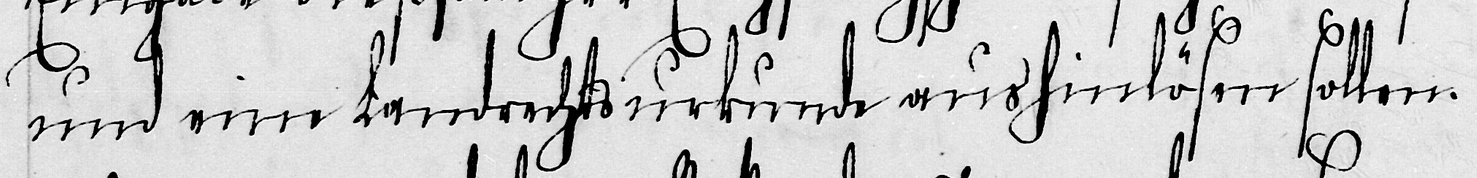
und eine Landrechtsurkunde aushinlösen sollen.
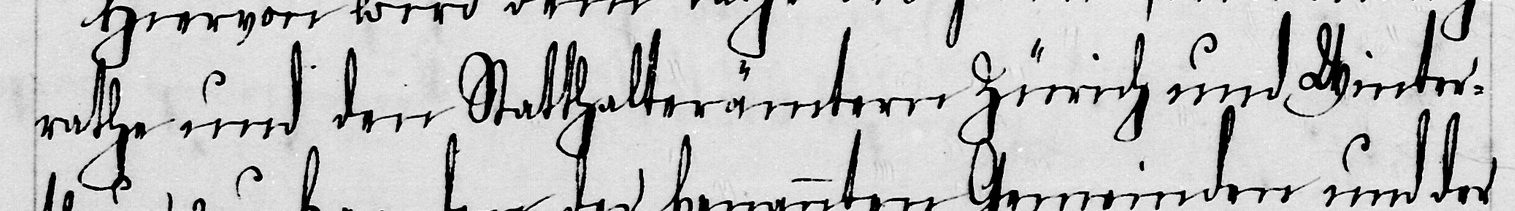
rathe und den Statthalterämtern Zürich und Winter¬
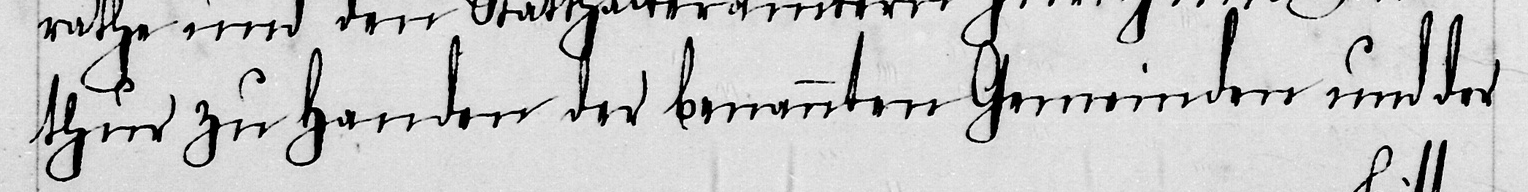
thur zu Handen der benannten Gemeinden und der
